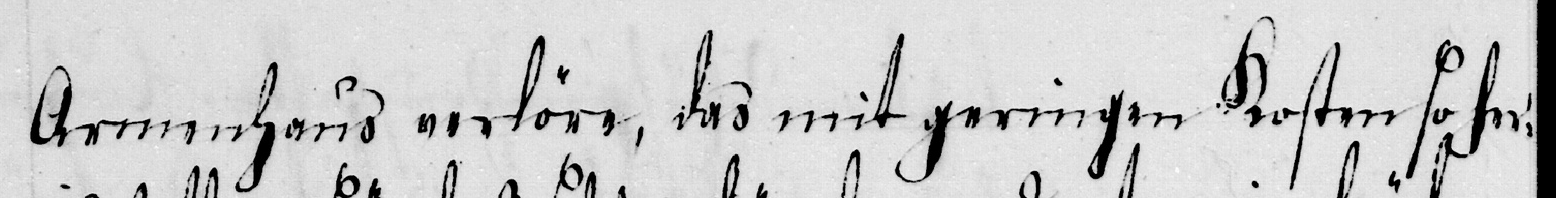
Armenhaus verlöre, das mit geringen Kosten so her¬
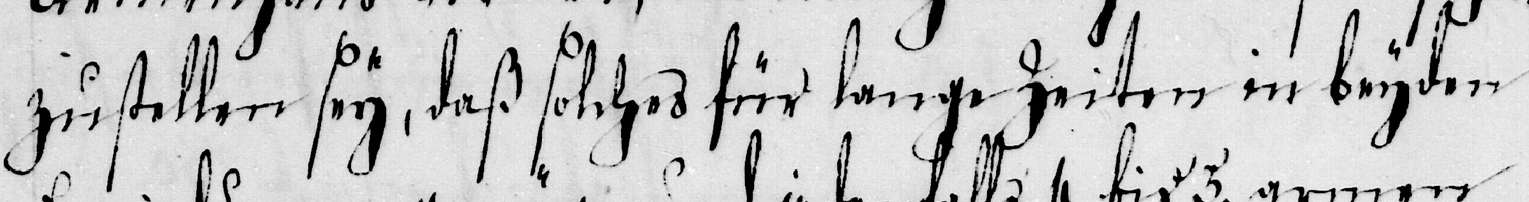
zustellen sey, daß solches für lange Zeiten in beyden
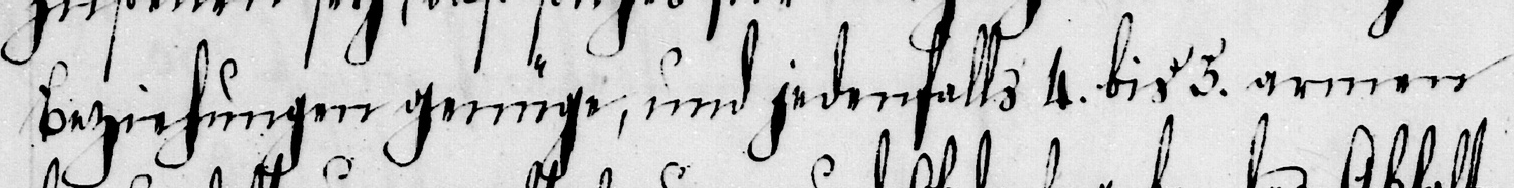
Beziehungen genüge, und jedenfalls 4. bis 5. armen
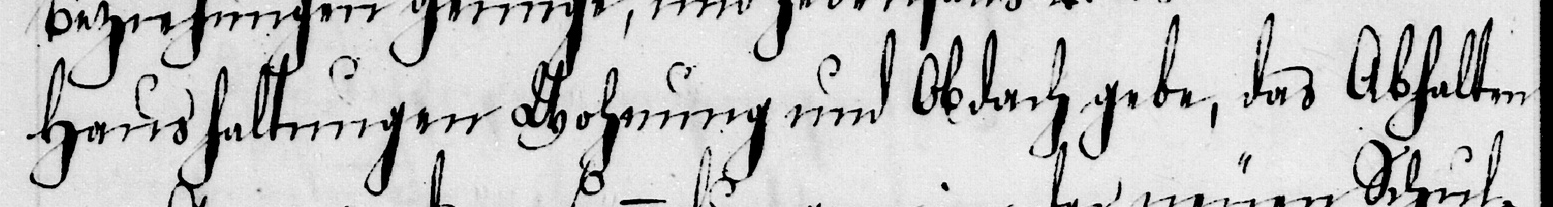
Haushaltungen Wohnung und Obdach gebe, das Abhalten
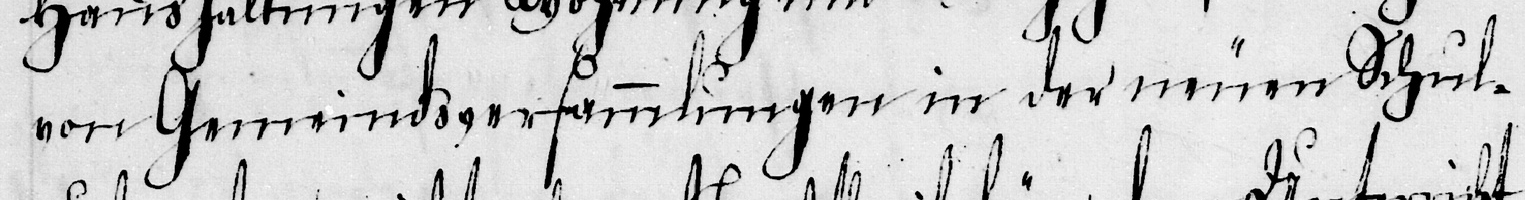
von Gemeindsversammlungen in der neuen Schul¬
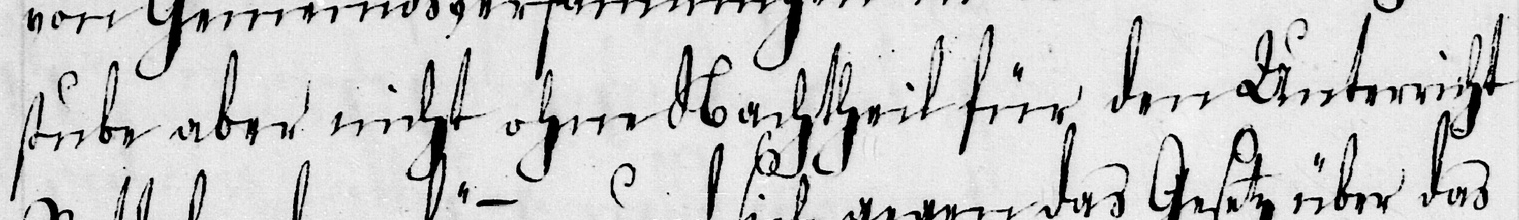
stube aber nicht ohne Nachtheil für den Unterricht
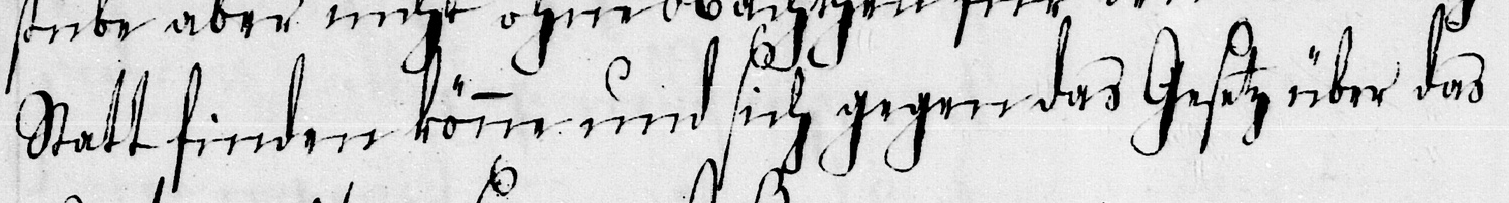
Statt finden könne und sich gegen das Gesetz über das
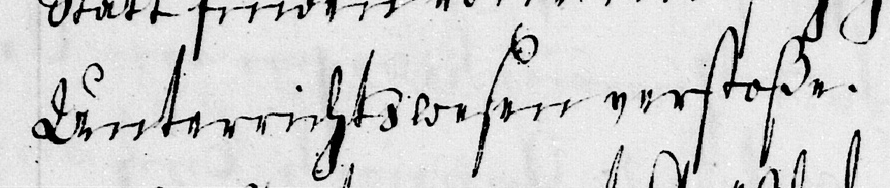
Unterrichtswesen verstoße.
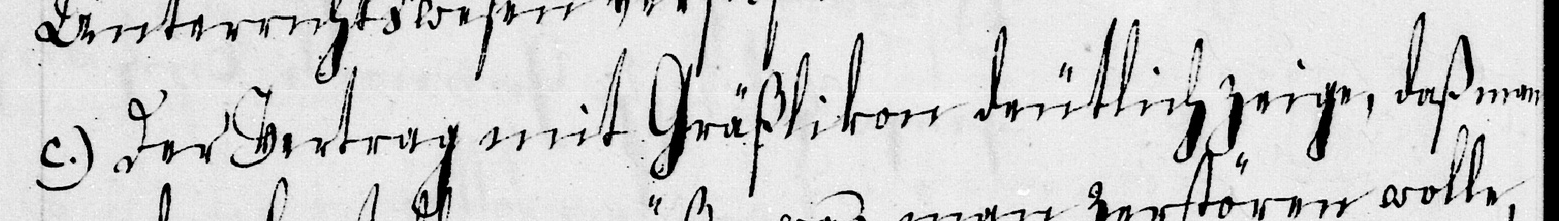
c.) Der Vertrag mit Gräßlikon deutlich zeige, daß man
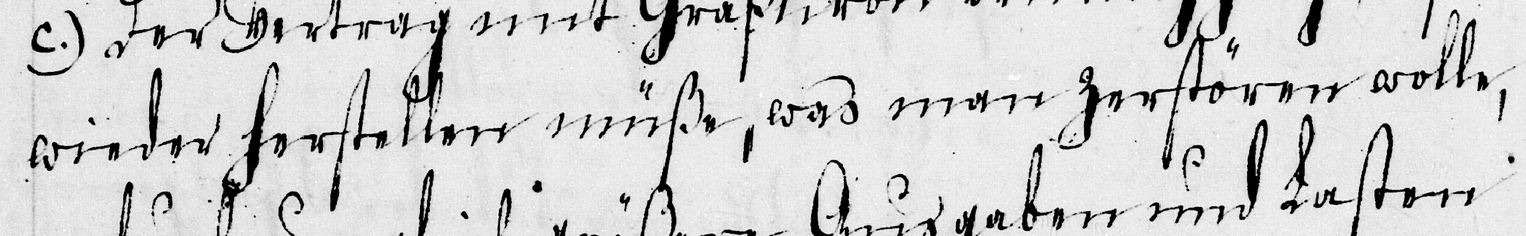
wieder herstellen müße, was man zerstören wolle,
